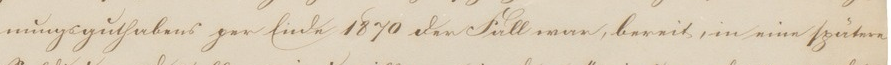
nungsguthabens per Ende 1870 der Fall war, bereit, in eine späteren
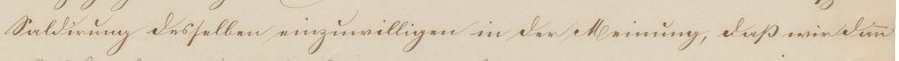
Saldirung desselben einzuwilligen in der Meinung, dass wir dann
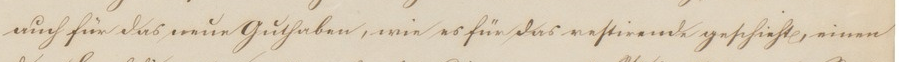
auch für das neue Guthaben, wie es für das restirende geschieht, einen
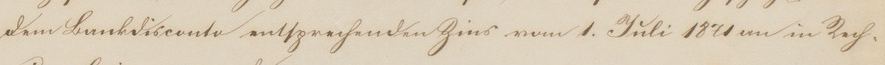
dem Bankdisconto entsprechenden Zins vom 1. Juli 1871 an in Rech-
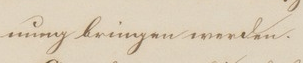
nung bringen werden.
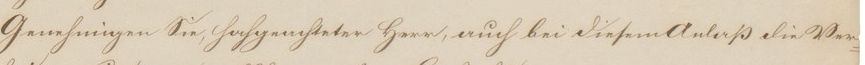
Genehmigen Sie, hochgeachteter Herr, auch bei diesem Anlaß die Ver-
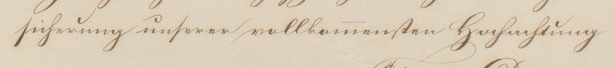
sicherung unserer vollkommensten Hochachtung.
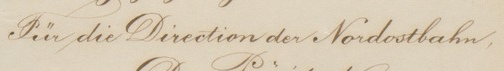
Für die Direction der Nordostbahn,
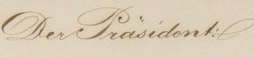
Der Präsident:
